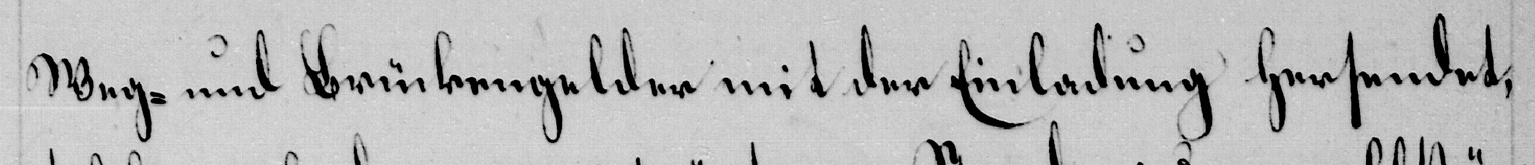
Weg- und Brückengelder mit der Einladung hersendet,
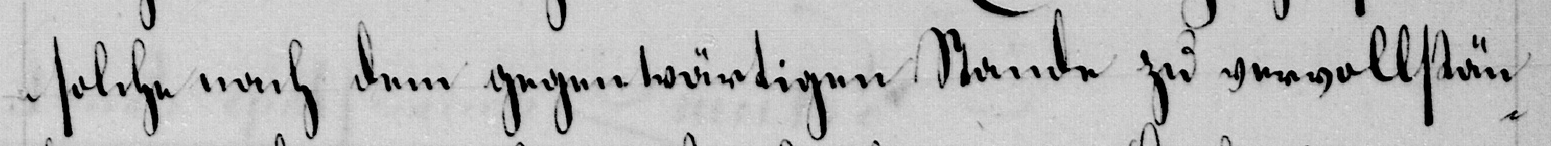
solche nach dem gegenwärtigen Stande zu vervollstän¬
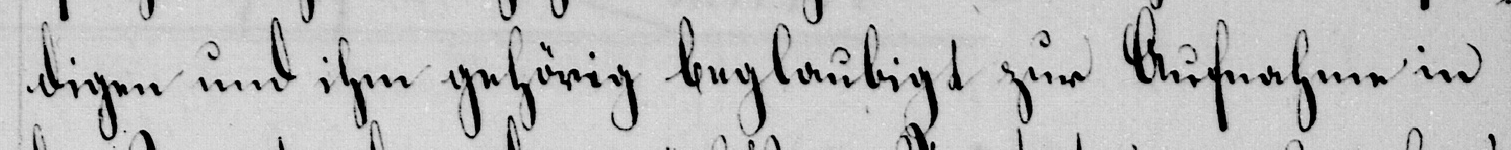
digen und ihm gehörig beglaubigt zur Aufnahme in
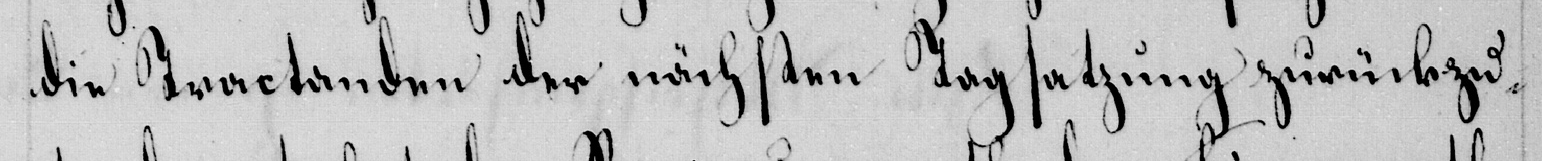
die Tractanden der nächsten Tagsatzung zurückzu¬
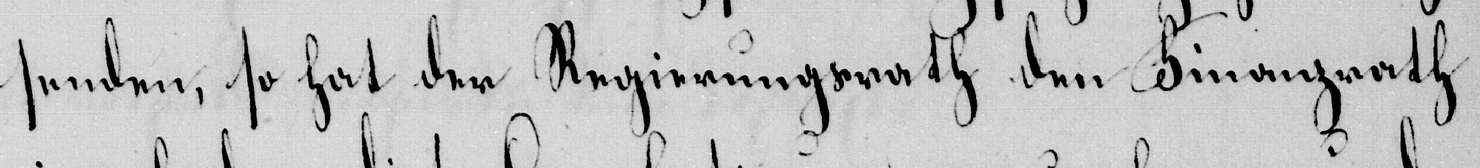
senden, so hat der Regierungsrath den Finanzrath
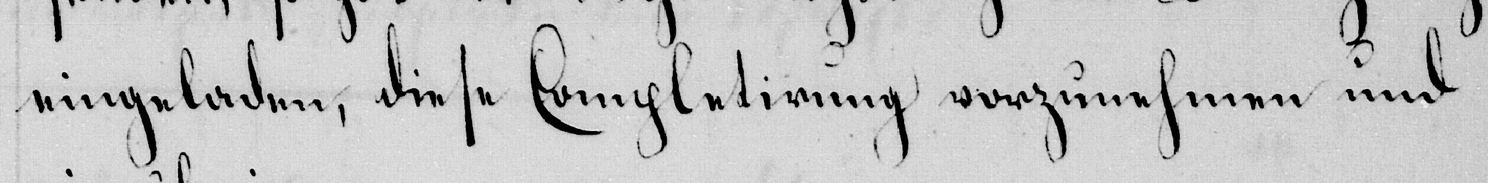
eingeladen, diese Completirung vorzunehmen und
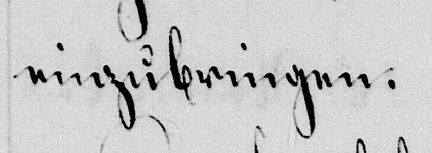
einzubringen.
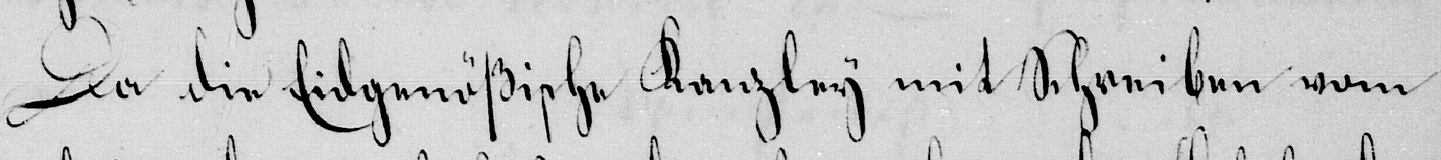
Da die Eidgenößische Kanzley mit Schreiben vom
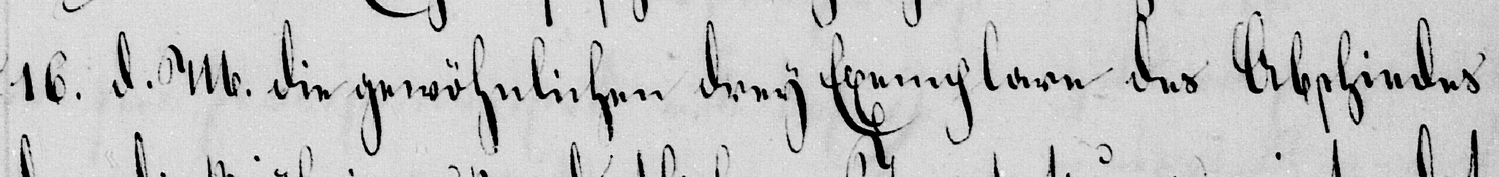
16. d. M. die gewöhnlichen drey Exemplare des Abschiedes
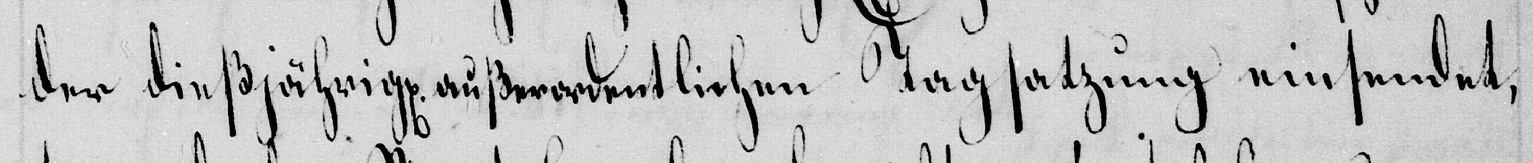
der dießjährig[en] außerordentlichen Tagsatzung einsendet,
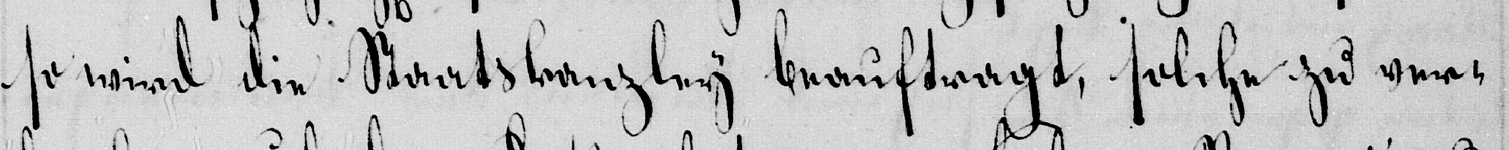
so wird die Staatskanzley beauftragt, solche zu ver¬
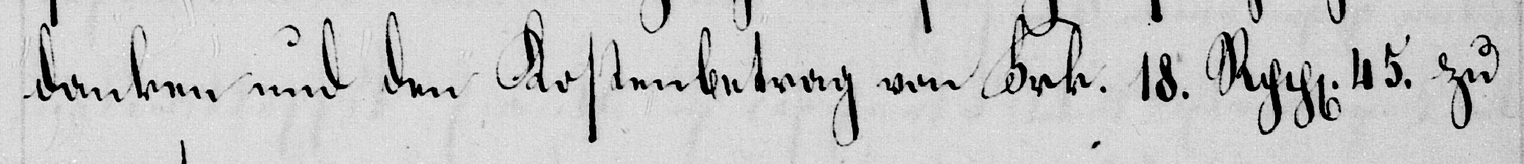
danken und den Kostenbetrag von Frk. 18. Rpp[en]. 45. zu
